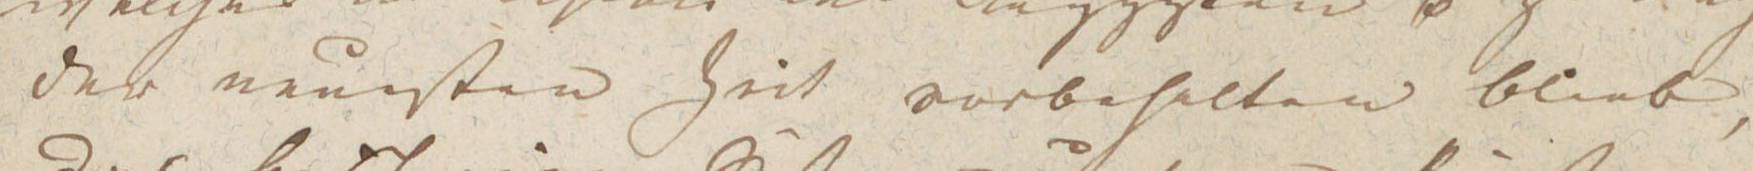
der neuesten Zeit vorbehalten blieb,
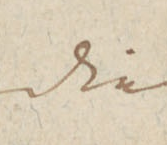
die
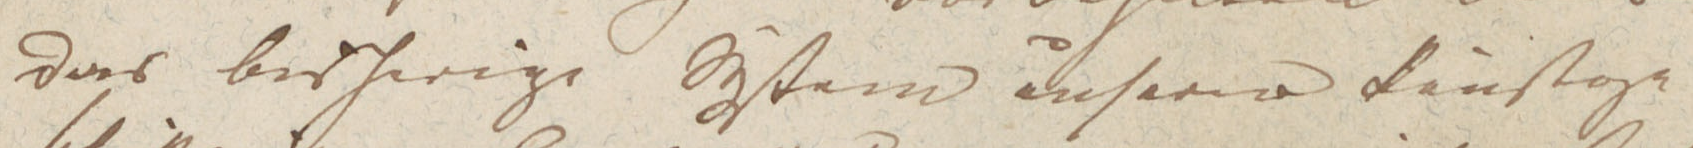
das bisherige System unserer kunstge-
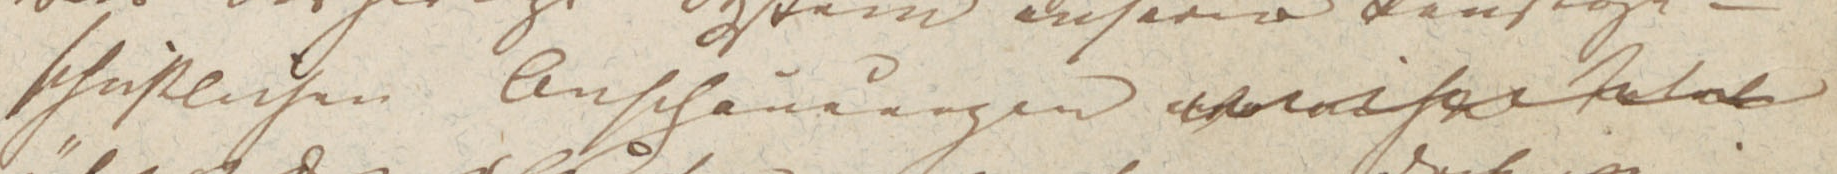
schichtlichen Anschauungen wo nicht total
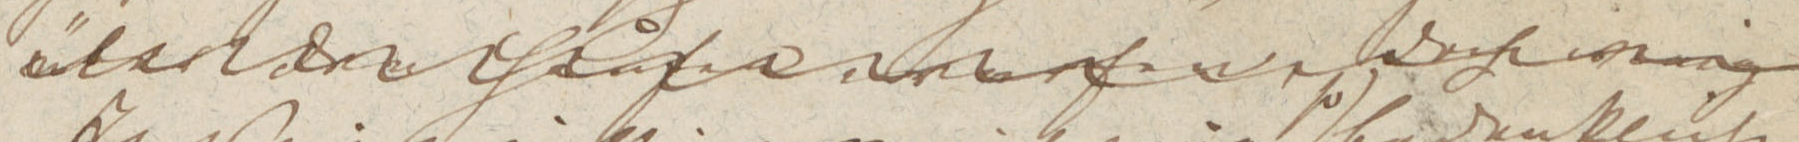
über den Haufen werfen, doch wenig-
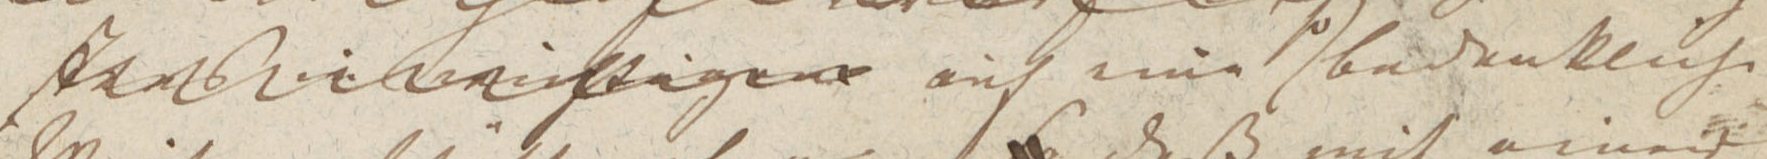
stens in wichtigen auf eine so bedenkliche
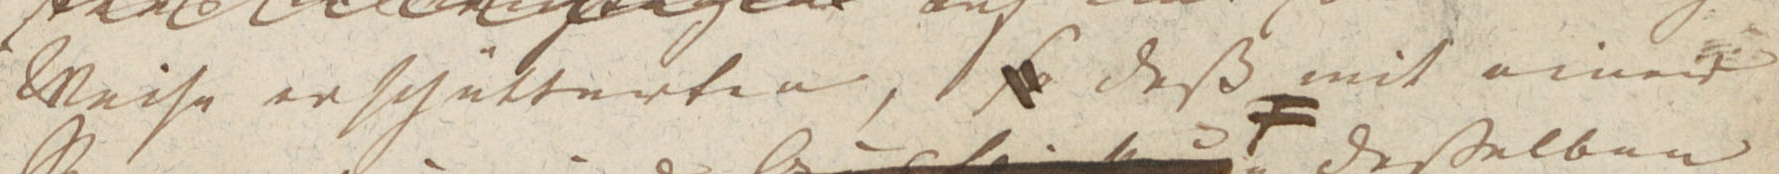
Weise erschütterten, so dass mit einer
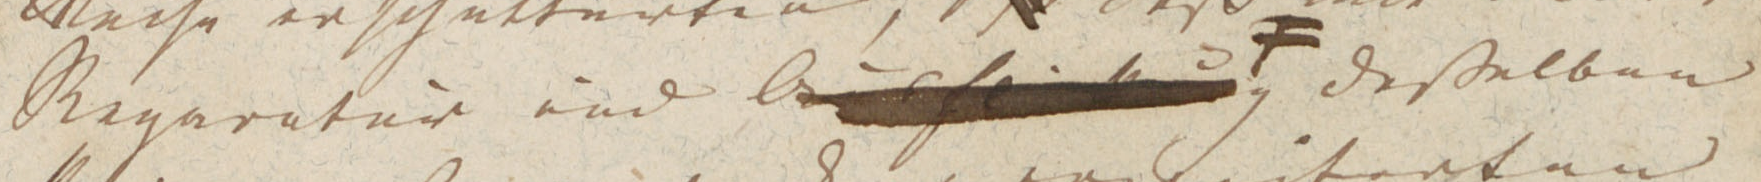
Reparatur und Ausflickung % desselben
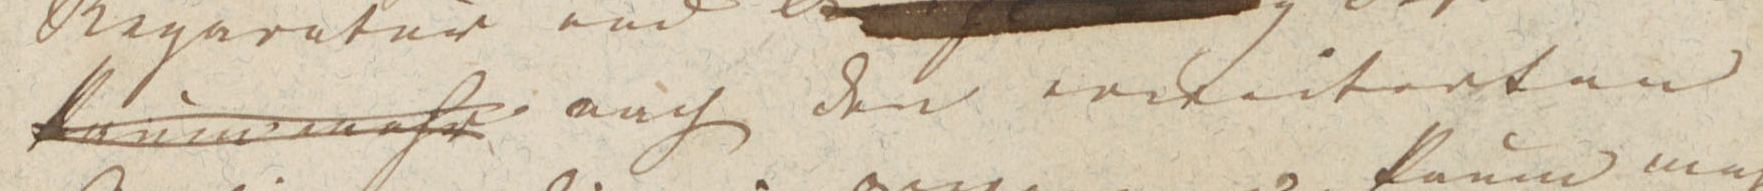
kaum mehr auch den erweiterten
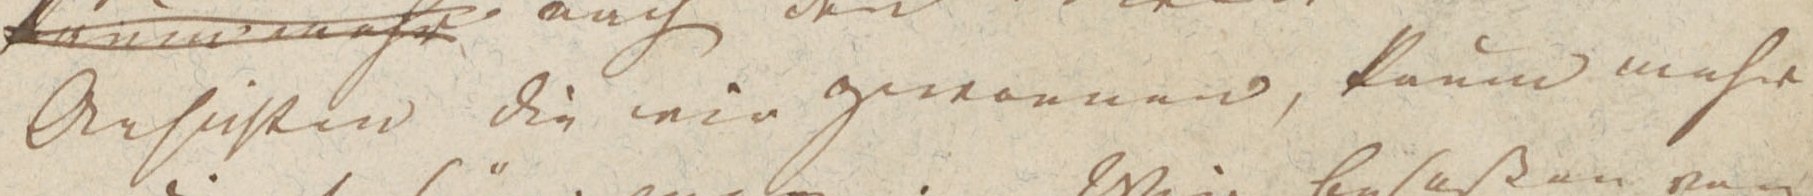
Ansichten die wir gewonnen, kaum mehr
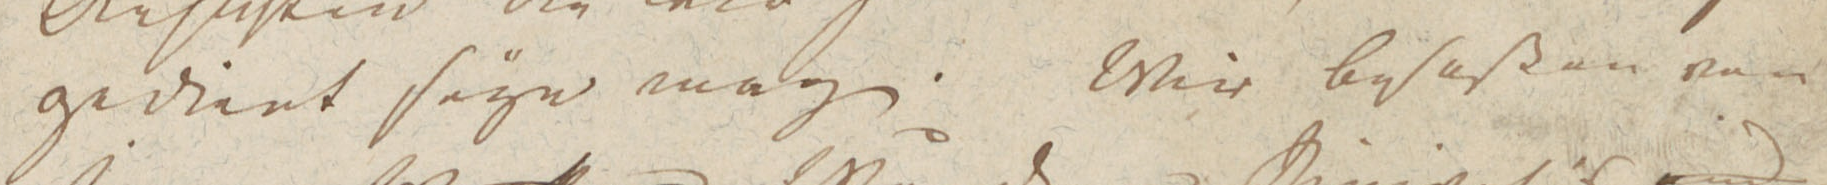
gedient seyn mag. Wir besassen von
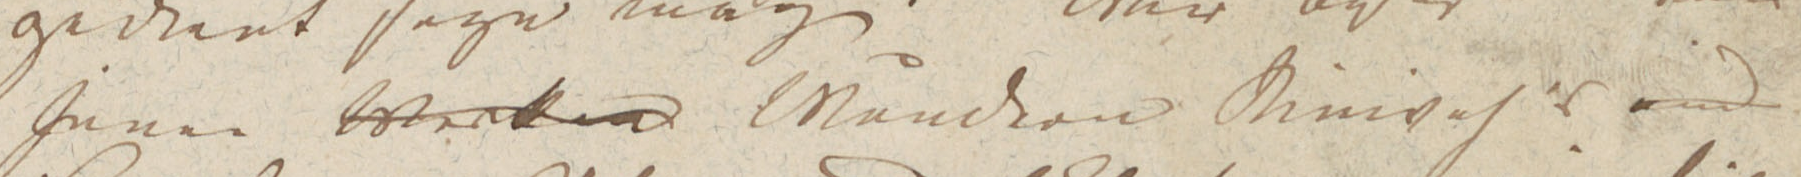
jenen Werken Wundern Niniveh's und
